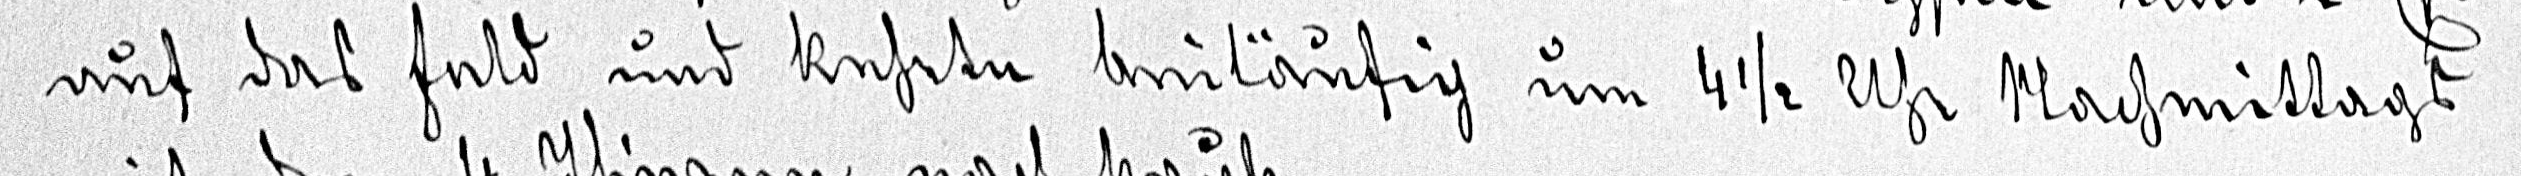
auf das Feld und kehrte beiläufig um 4½ Uhr Nachmittags
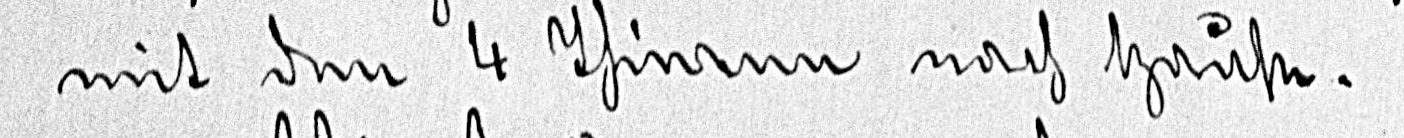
mit den 4 Thieren nach Hause.
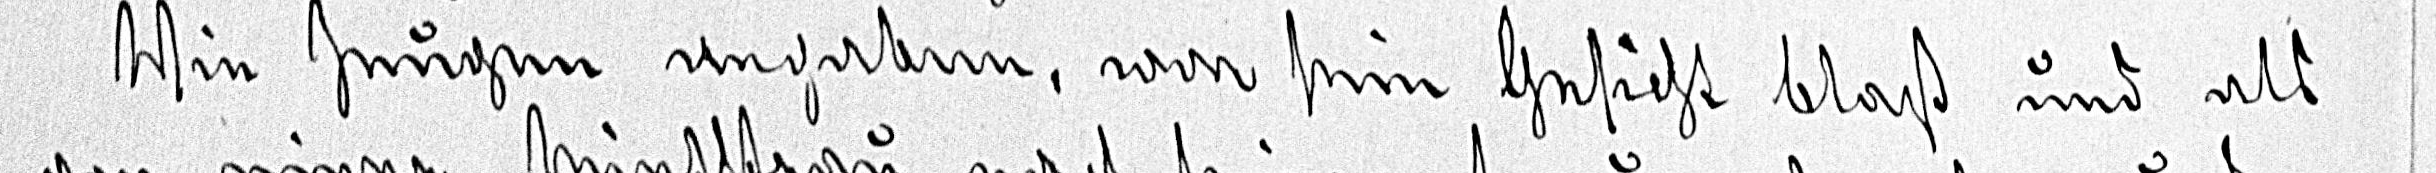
Wie Zeugen angaben, war sein Gesicht blaß und als
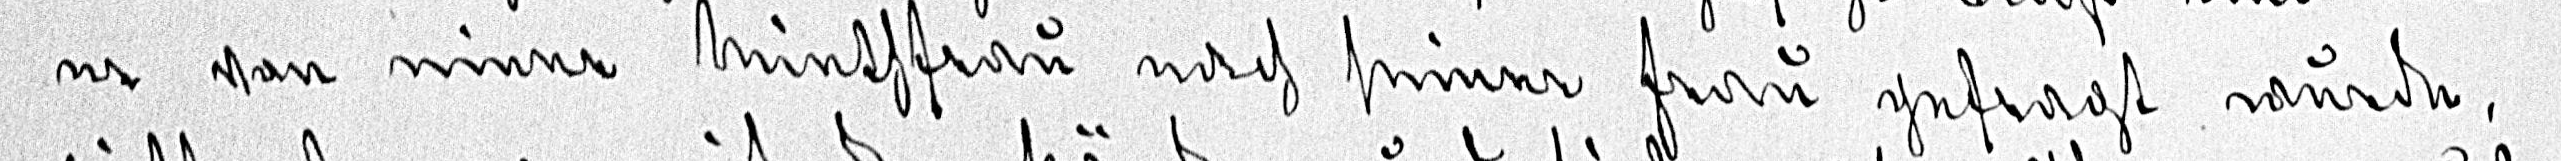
er von einer Miethfrau nach seiner Frau gefragt wurde,
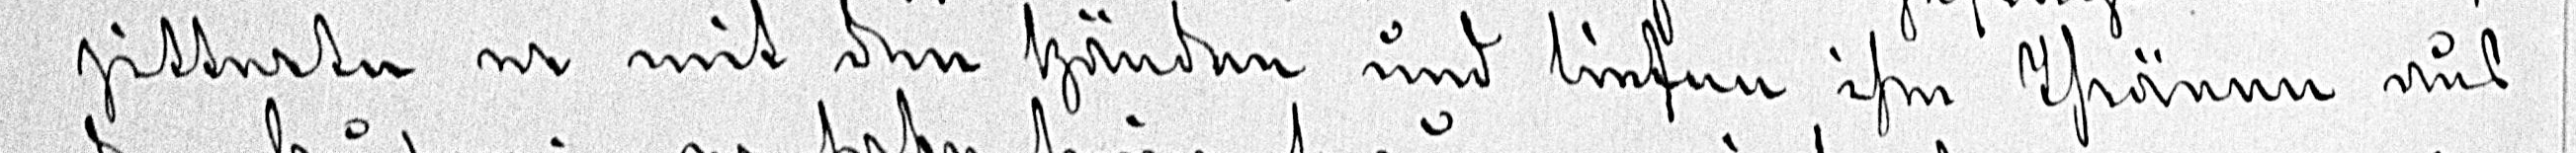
zitterte er mit den Händen und liefen ihm Thränen aus
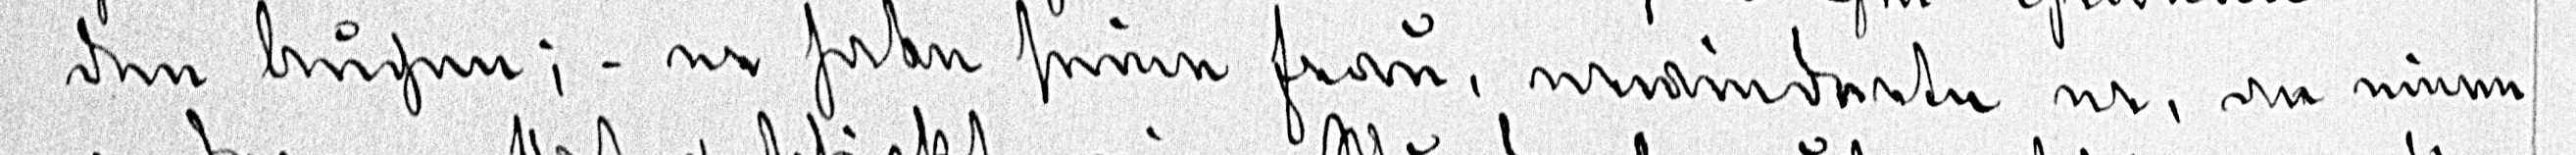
den Augen; - er habe seine Frau, erwiederte er, an einen
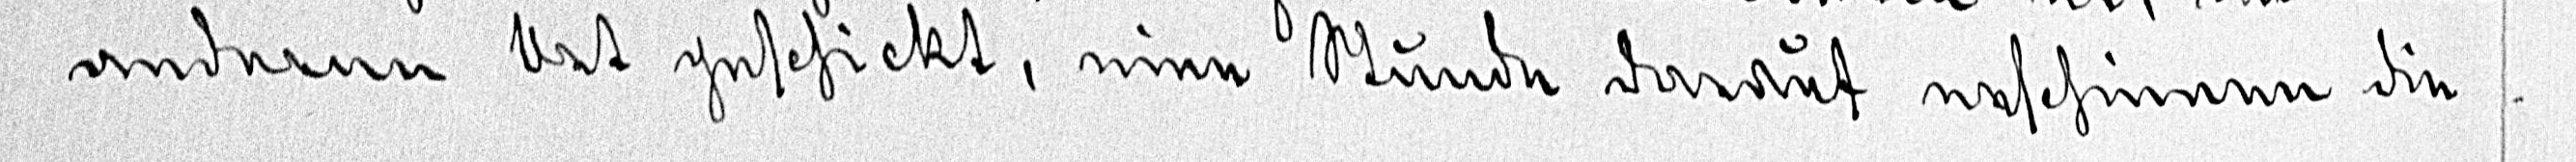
anderen Ort geschickt, eine Stunde darauf erschienen die
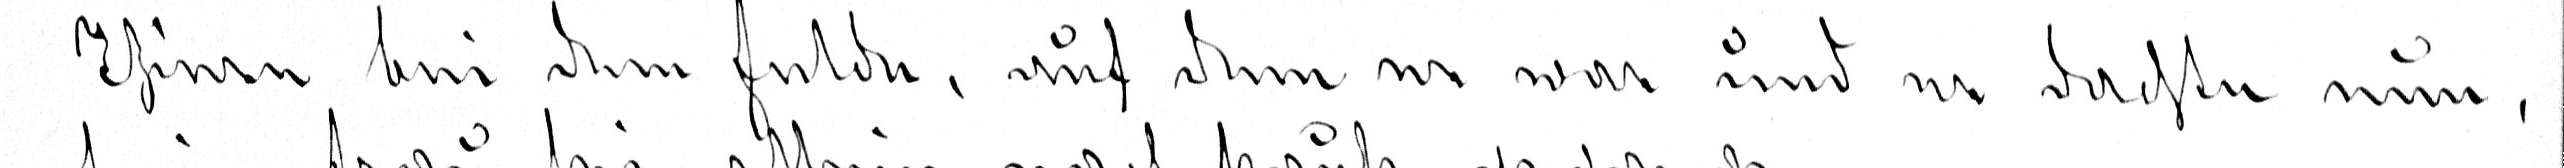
Thiere bei dem Felde, auf dem er war und er dachte nun,
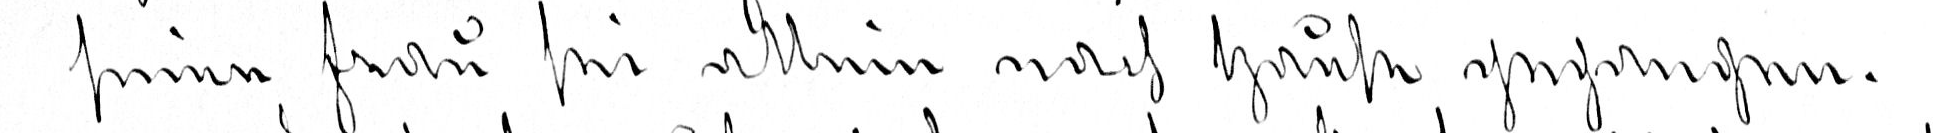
seine Frau sei allein nach Hause gegangen.
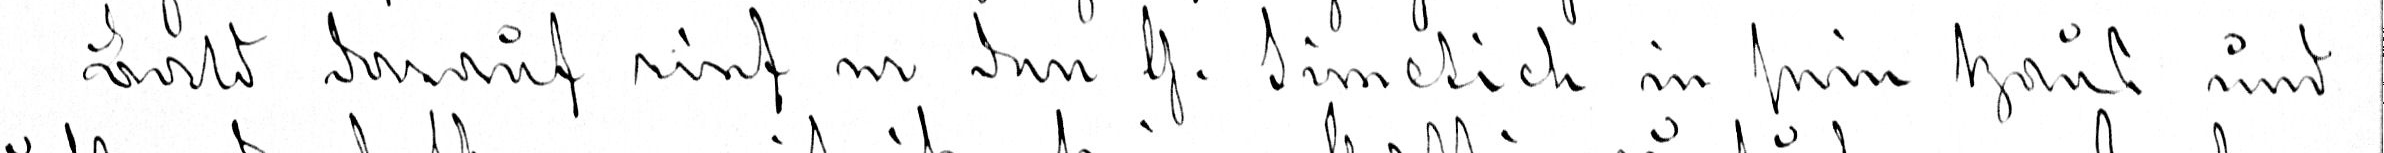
Bald darauf rief er den G. Simetich in sein Haus und
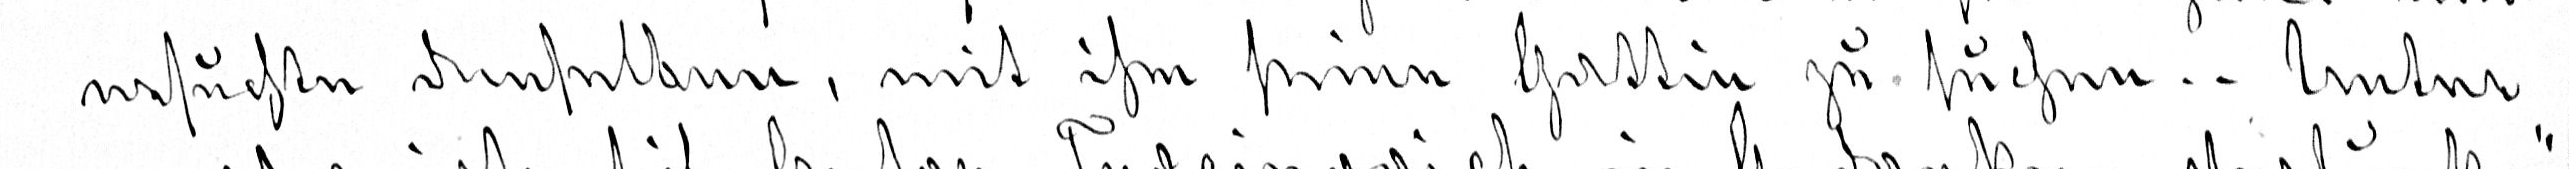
ersuchte denselben, mit ihm seine Gattin zu suchen.- Unter¬
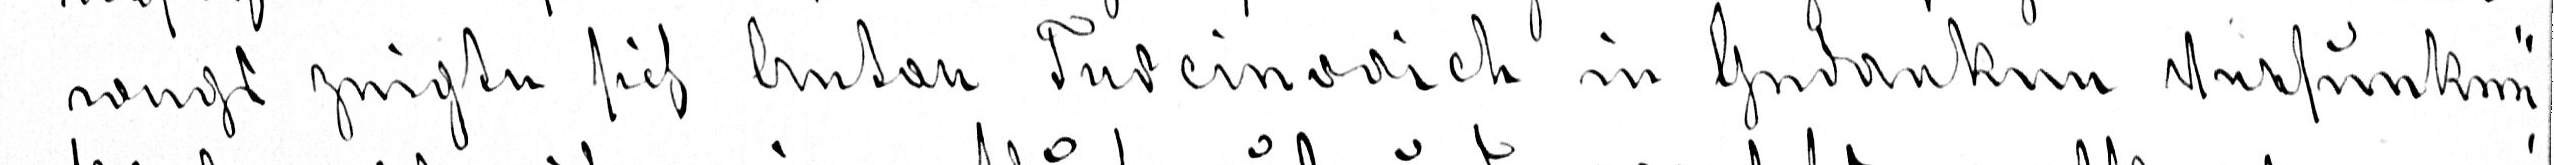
wegs zeigte sich Anton Turcinovich in Gedanken versunken,
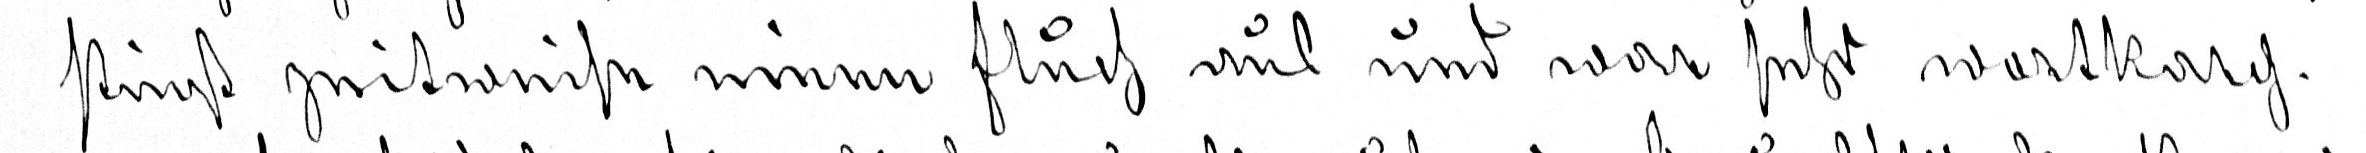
stieß zeitweise einen Fluch aus und war sehr wortkarg.
